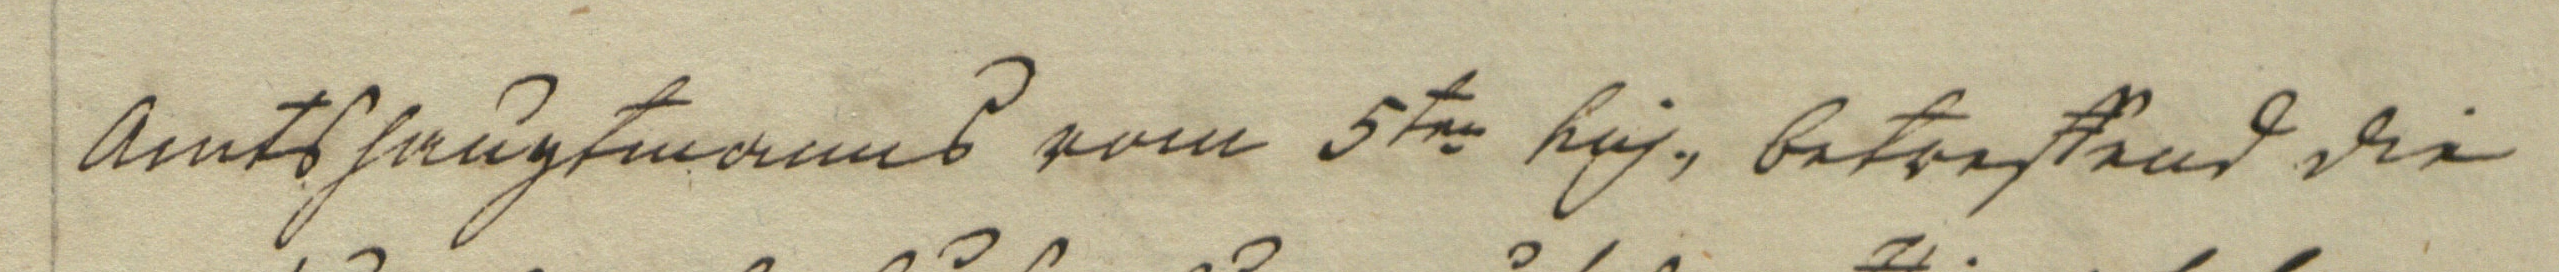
Amtshauptmanns vom 5 ten huj., betreffend die
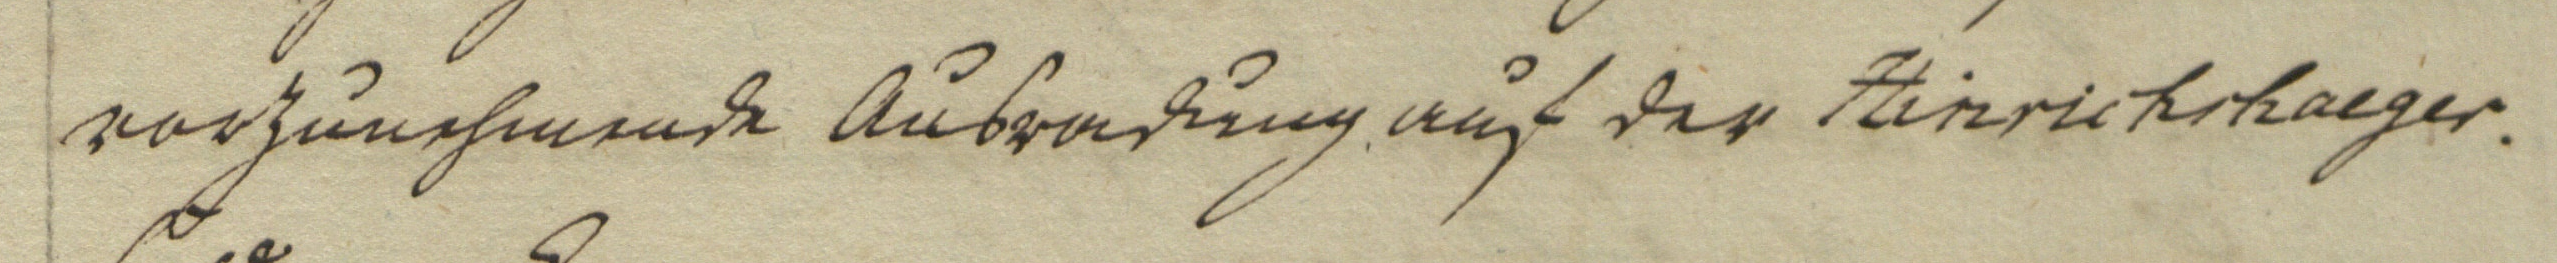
vorzunehmende Auradung auf der Hinrichshaeger.
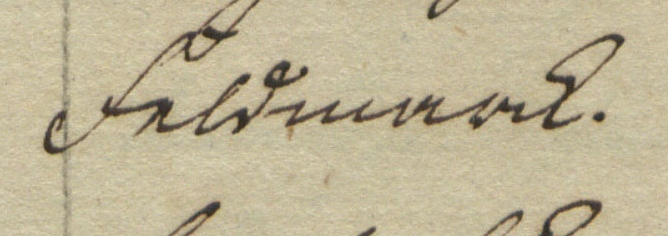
Feldmarck
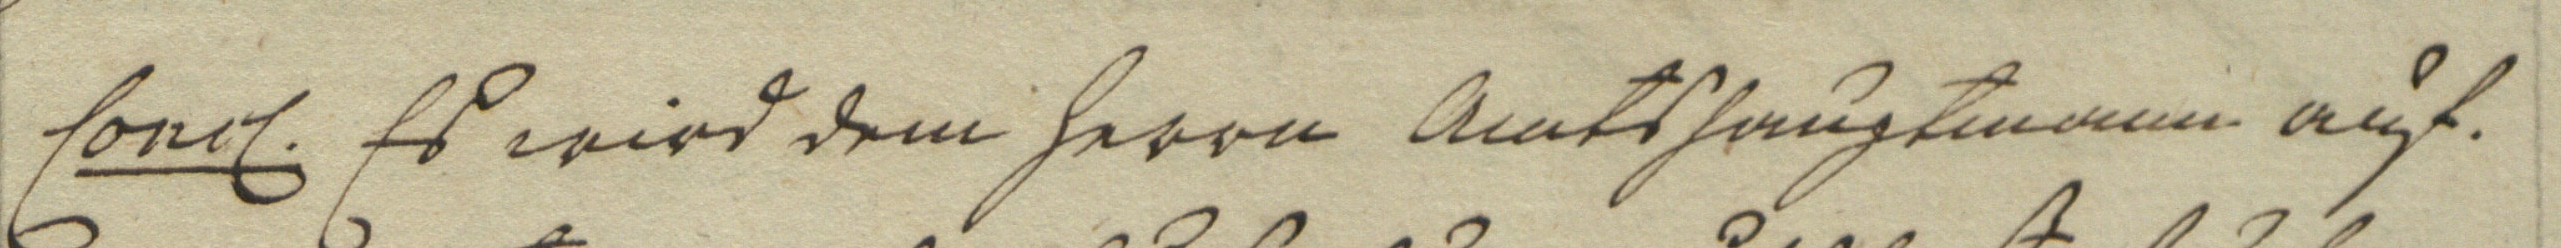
Concl. Es wird dem Herrn Amtshauptmann auf
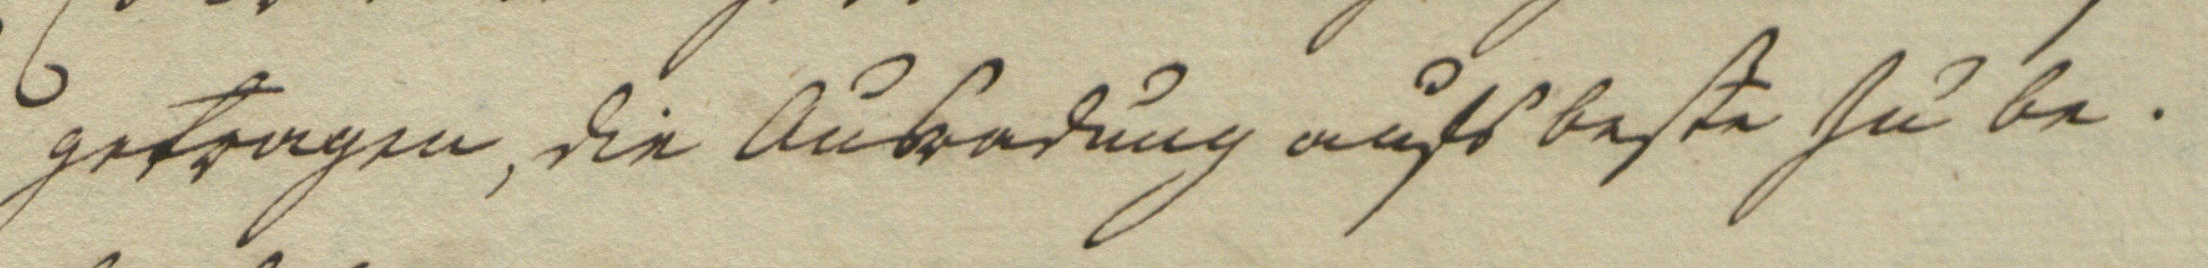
getragen, die Ausradung aufs beste zu be¬
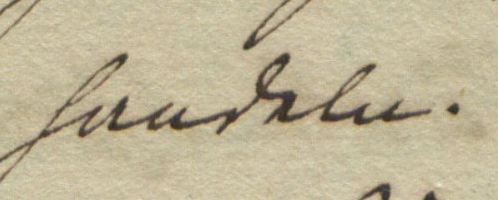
handeln.
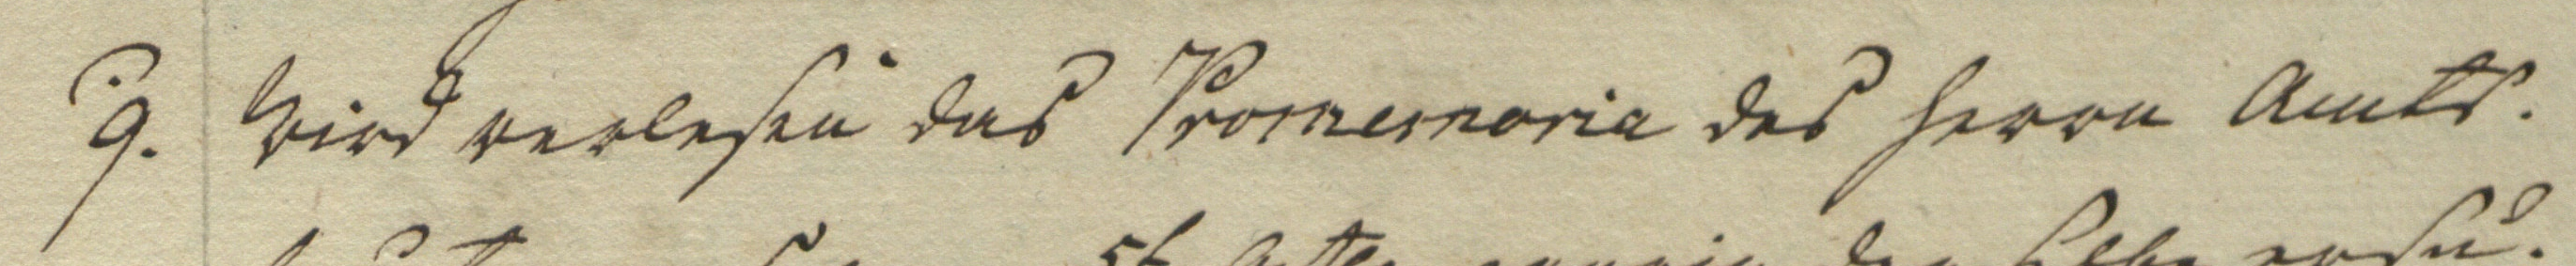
9. Wird verlesen das Promemoria des Herrn Amts¬
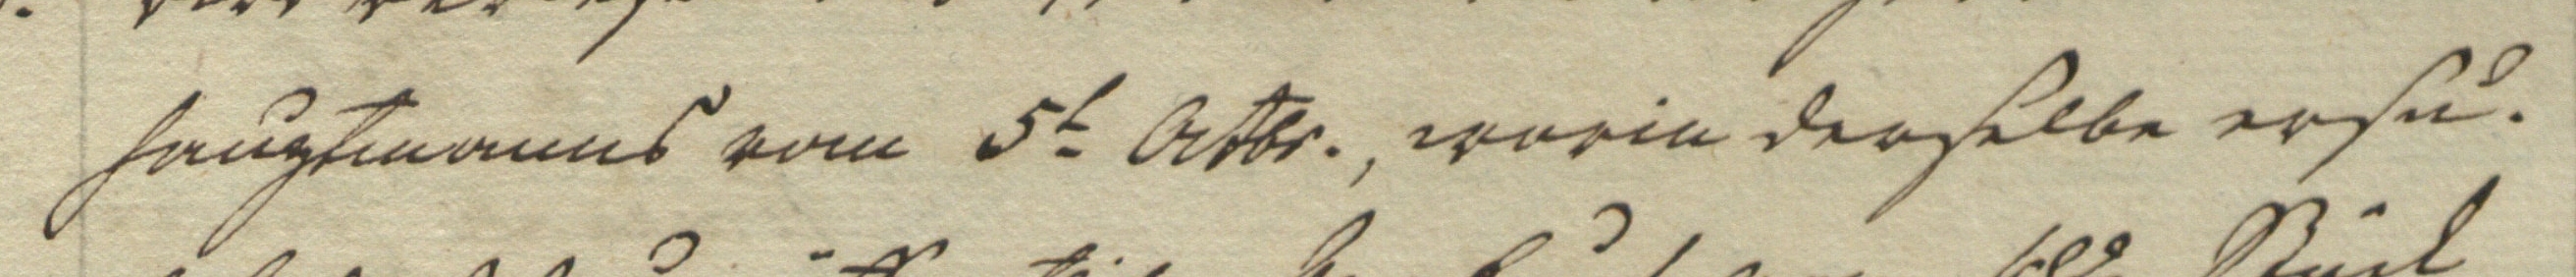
hauptmanns vom 5 Octbr., worin derselbe ersu¬
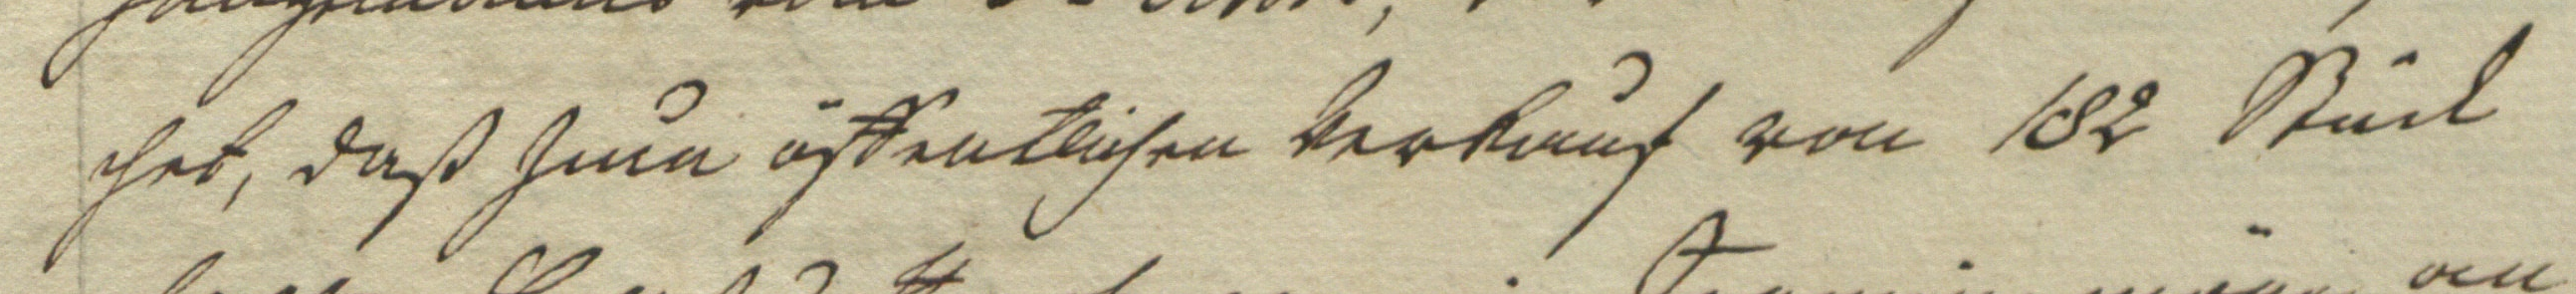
chet, daß zum öffentlichen Verkauf von 182 Stück
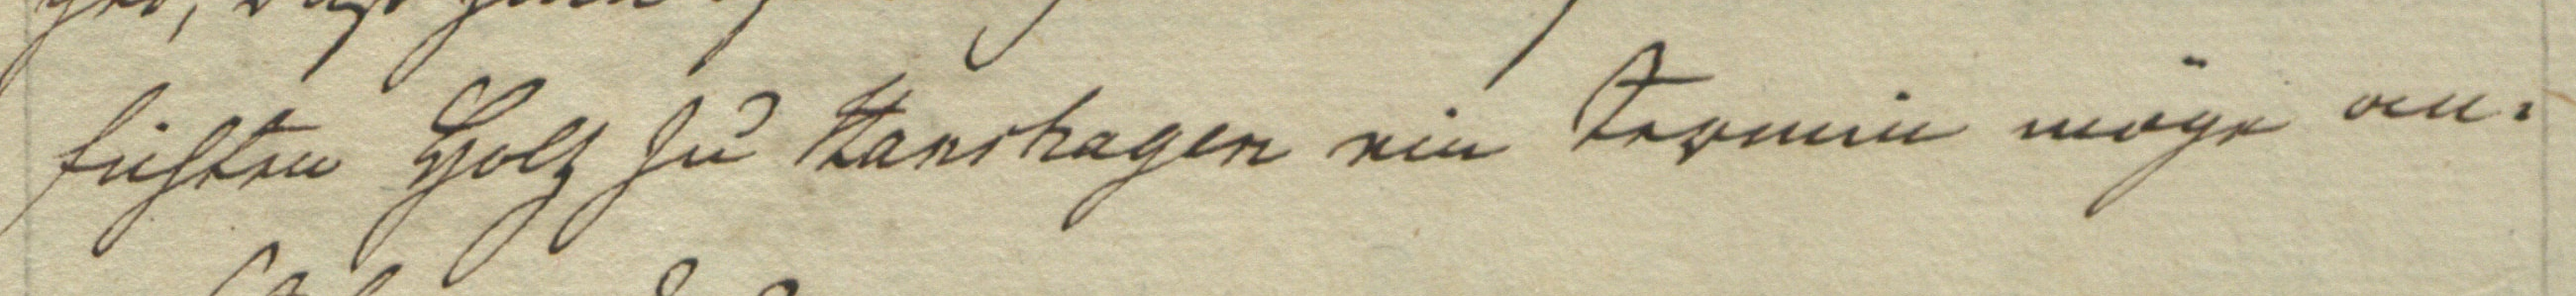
Fichten Holz zu Hanshagen ein Termin möge an¬
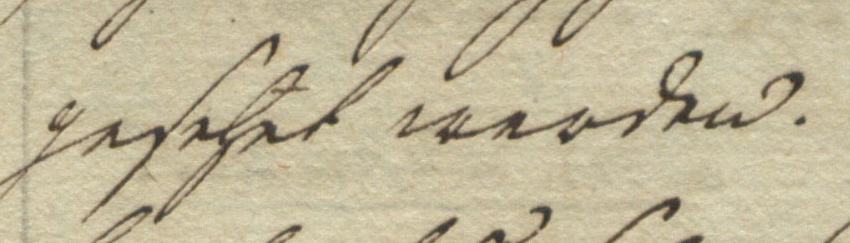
gesetzet werden.
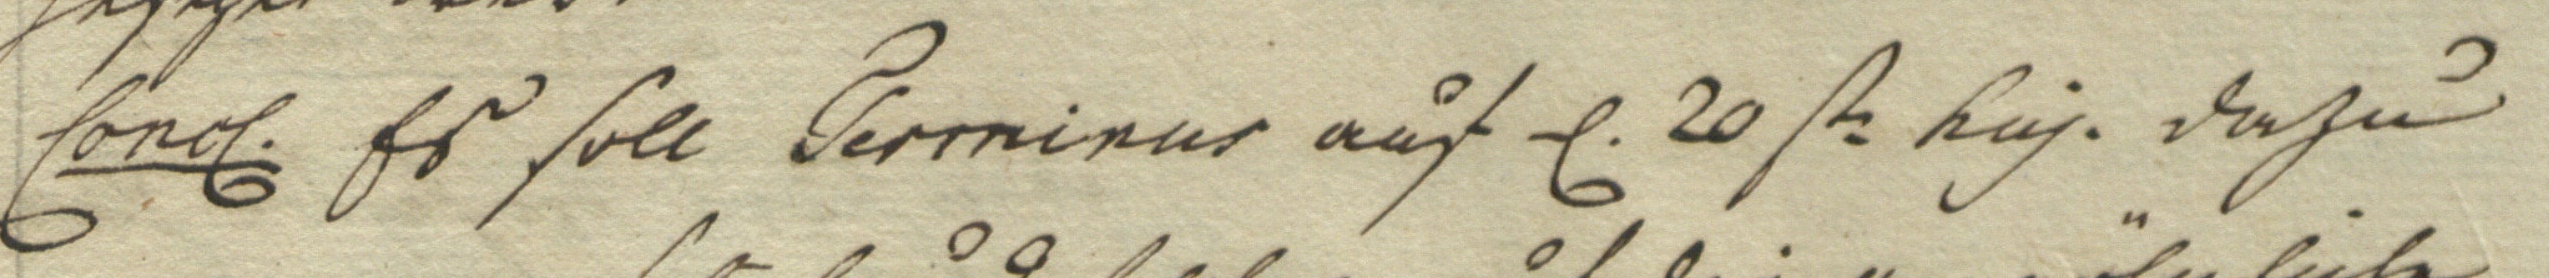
Concl. Es soll Terminus auf d. 20 st. huj. dazu
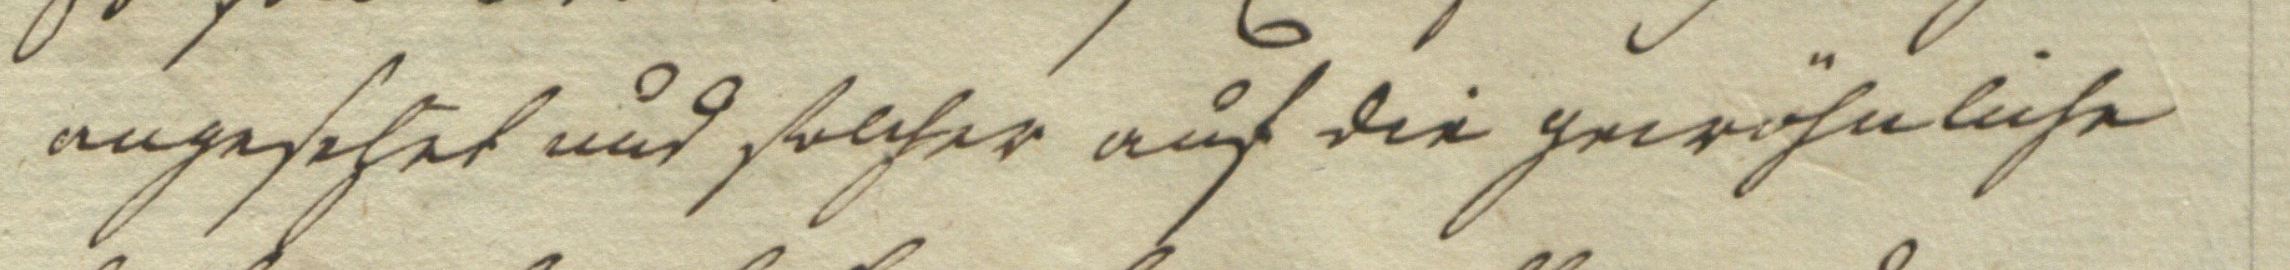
angesetzet und solcher auf die gewöhnliche
